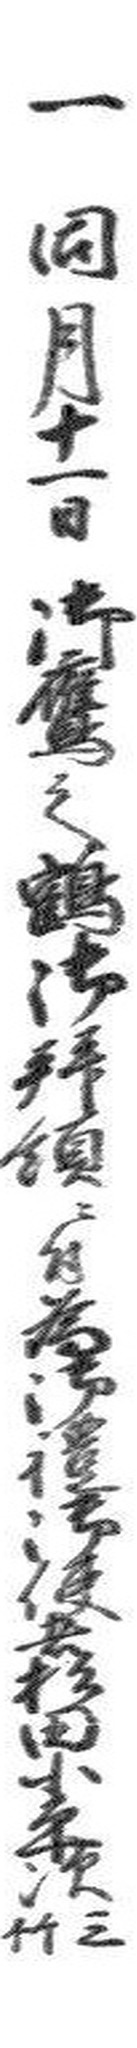一同月十一日御鷹之鶴御拝領ニ付為御礼御使者杉田小平次三竹
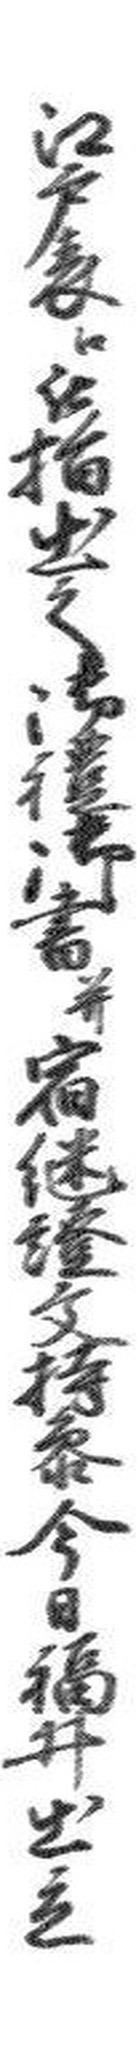江戸表江被指出之御礼御書幷宿継証文持参今日福井出立
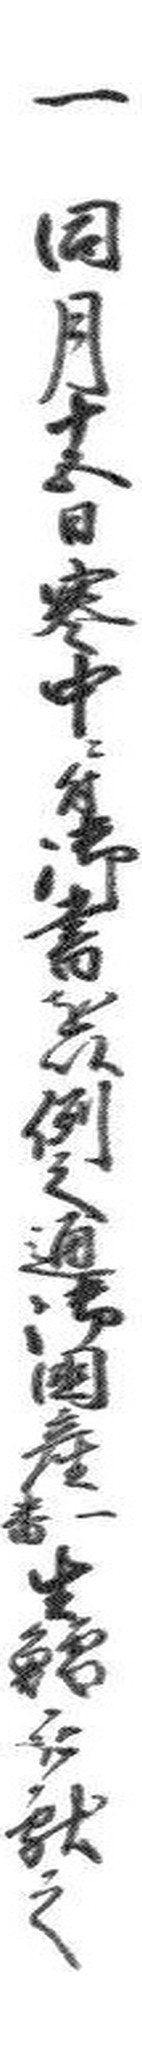一同月十五日寒中ニ付御書を以例之通御国産一番生鱈被献之
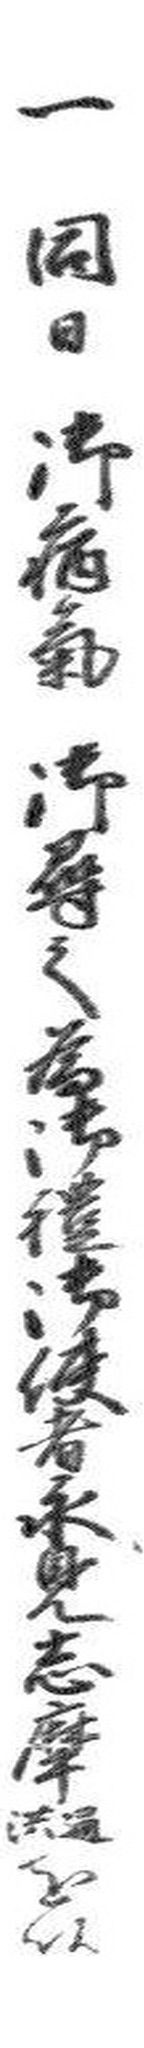一同日御病気御尋之為御礼御使者永見志摩道洪を以
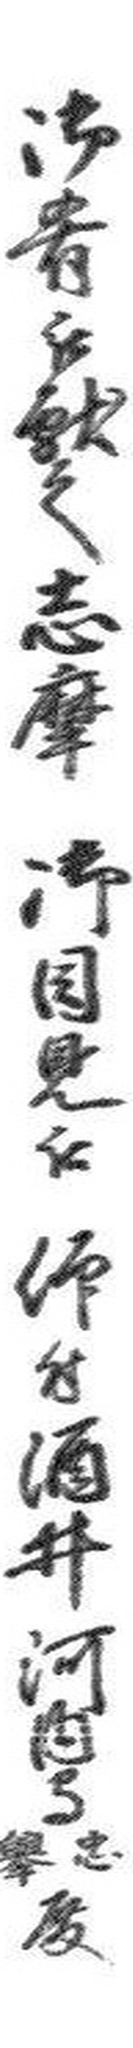御肴被献之志摩御目見被仰付酒井河内守忠挙殿

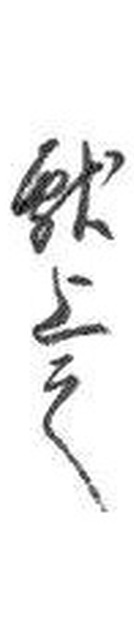献上之
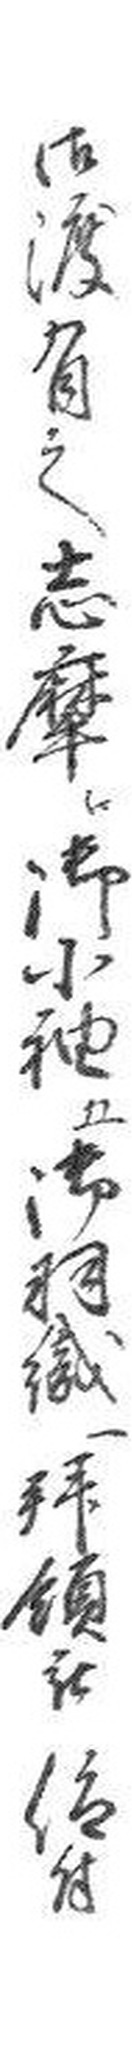御渡有之志摩江御小袖五御羽織一拝領被仰付
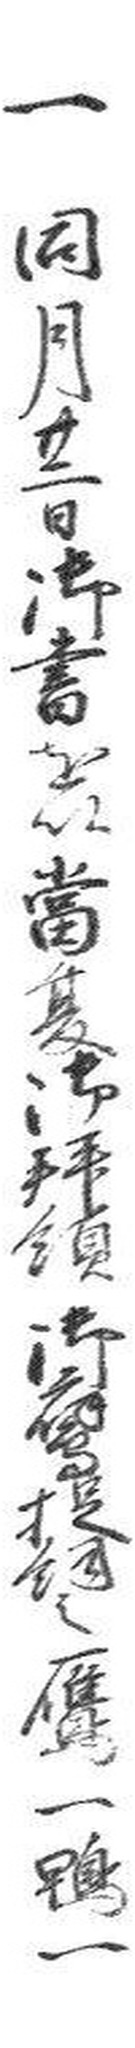一同月廿二日御書を以当夏御拝領御鷹捉飼之鷹一鴨一
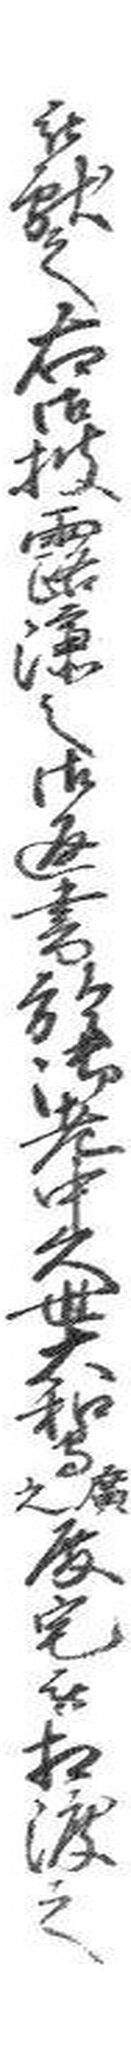被献之右御披露済之御返書於御老中久世大和守広之殿宅被相渡之
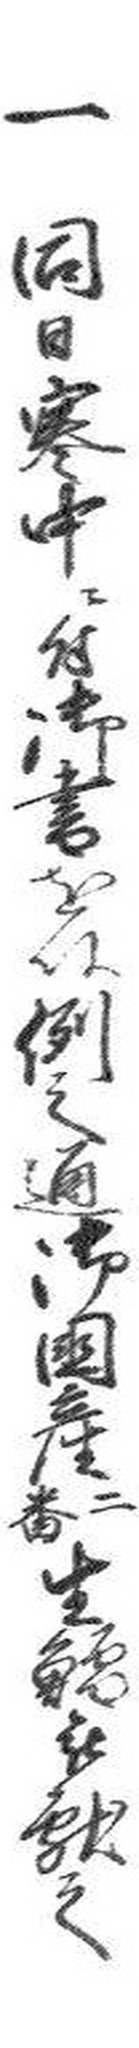一同日寒中ニ付御書を以例之通御国産二番生鱈被献之
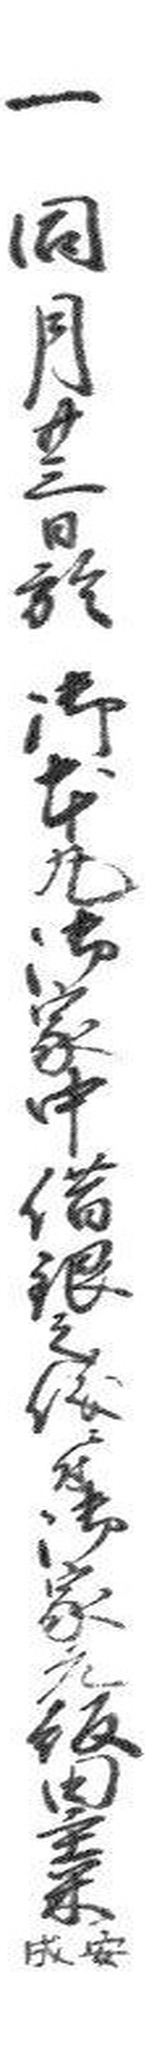一同月廿三日於御本丸御家中借銀之儀ニ付御家元飯田主米安成
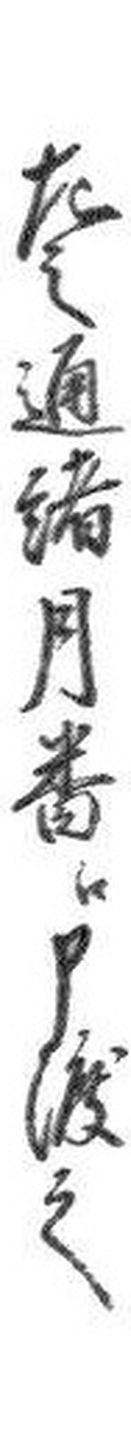左之通諸月番江申渡之
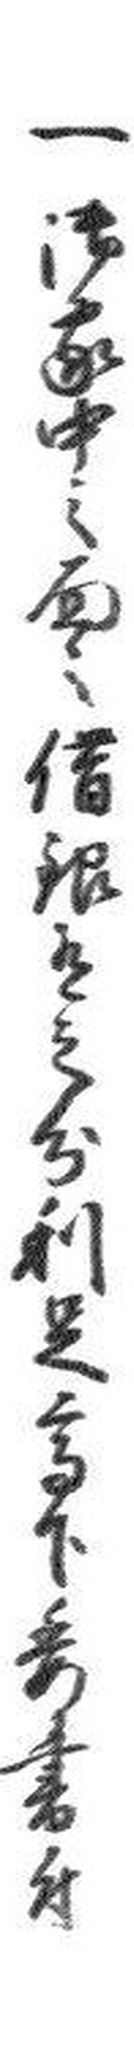一御家中之面々借銀有之分利足高下委書付
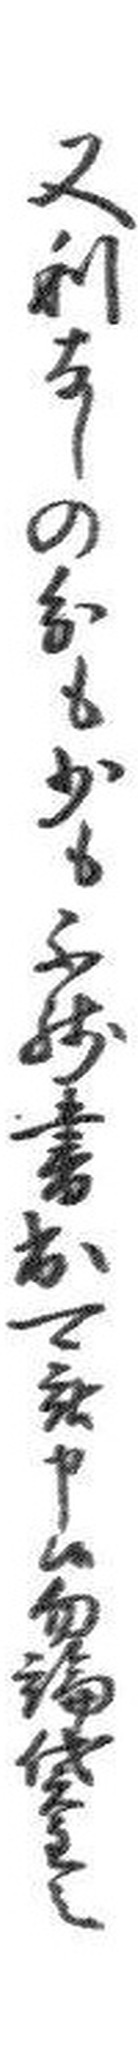又利なしの分も少も不残書出可被申候勿論貸主之
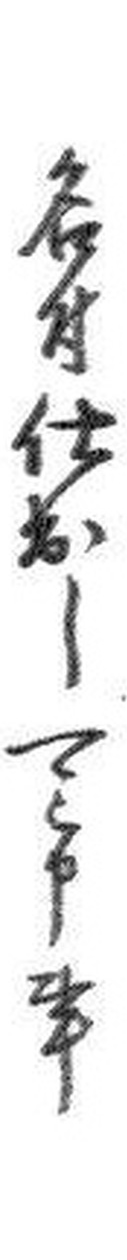名付仕出し可被申事
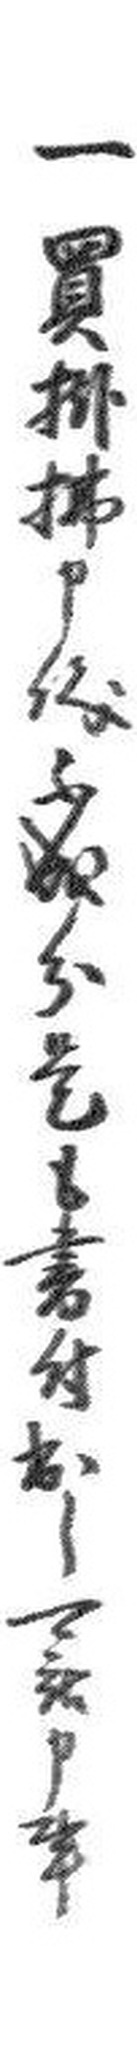一買掛払申儀不成分是も書付出し可被申事
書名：家譜 八 光通公 従寛文十年到同十二年
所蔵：福井県文書館 Fukui Prefectural Archives
